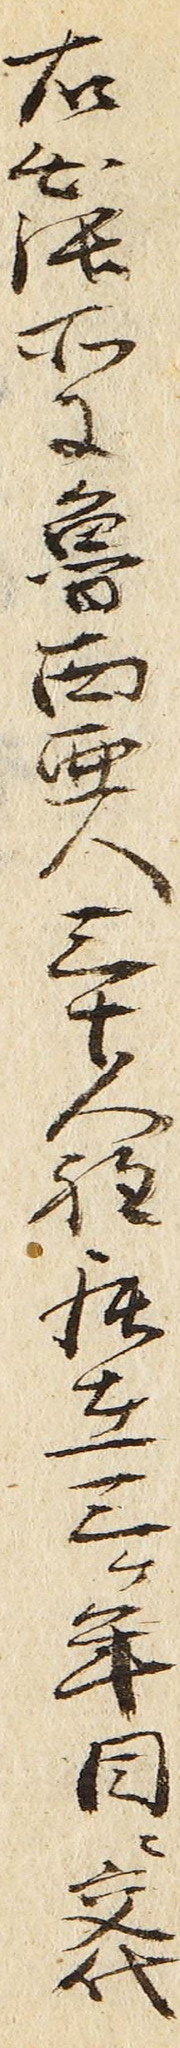右出張所に魯西亜人三十人程罷在三ヶ年目に交代
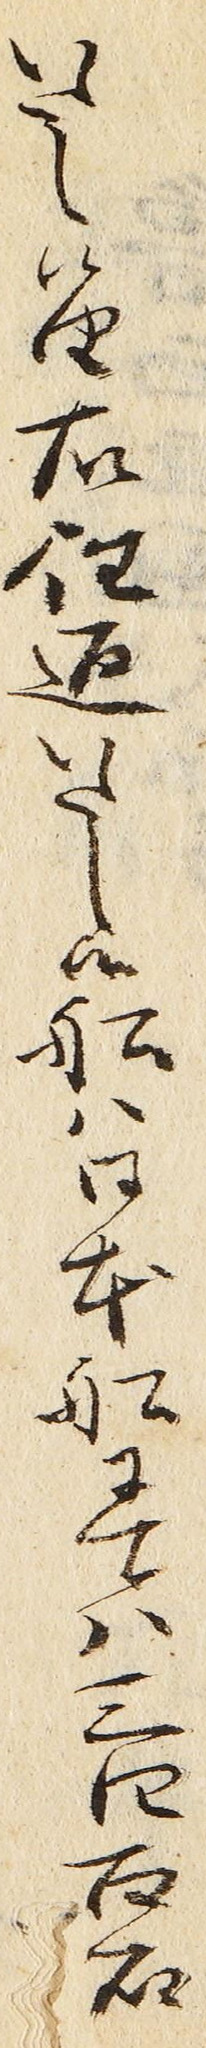いたし候由右往返いたし候船は日本船にては三四百石
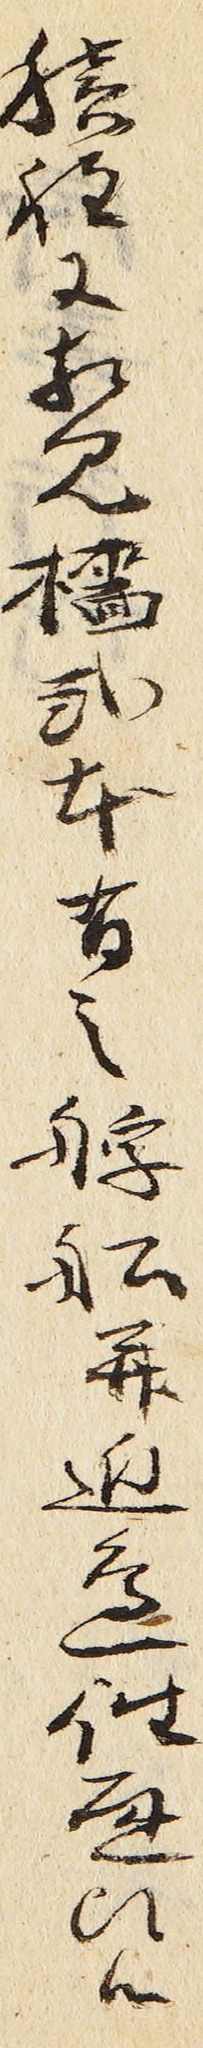積程に相見檣弐本有之艀船并近辺往通ひ候
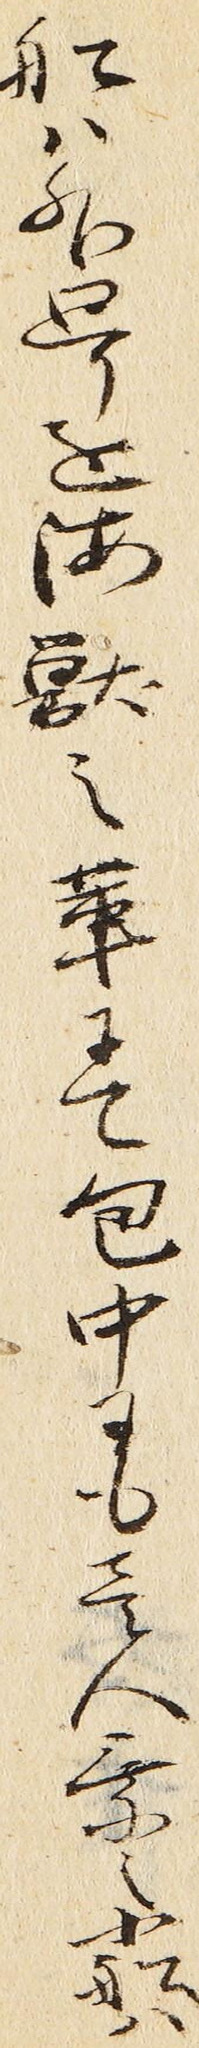船は外廻りを海獣の革にて包中にも壱人乗之小船は
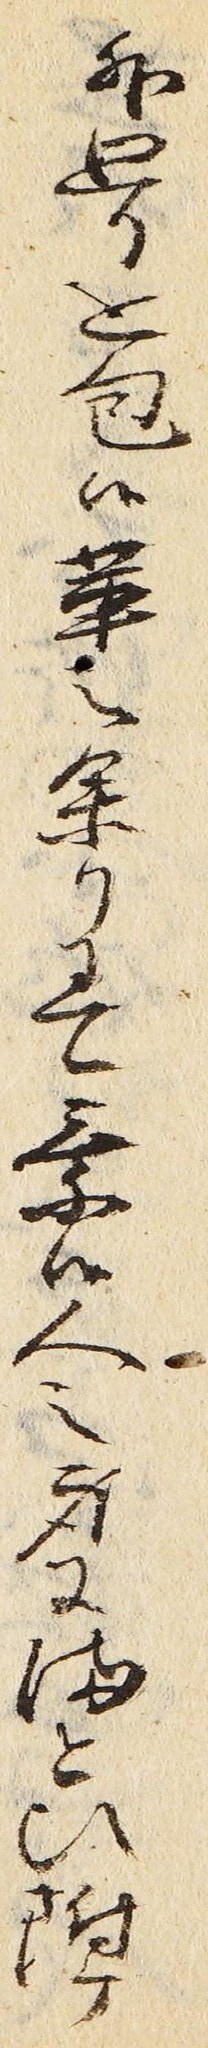外廻りを包候革之余りにて乗候人之身にまとひ附ヶ
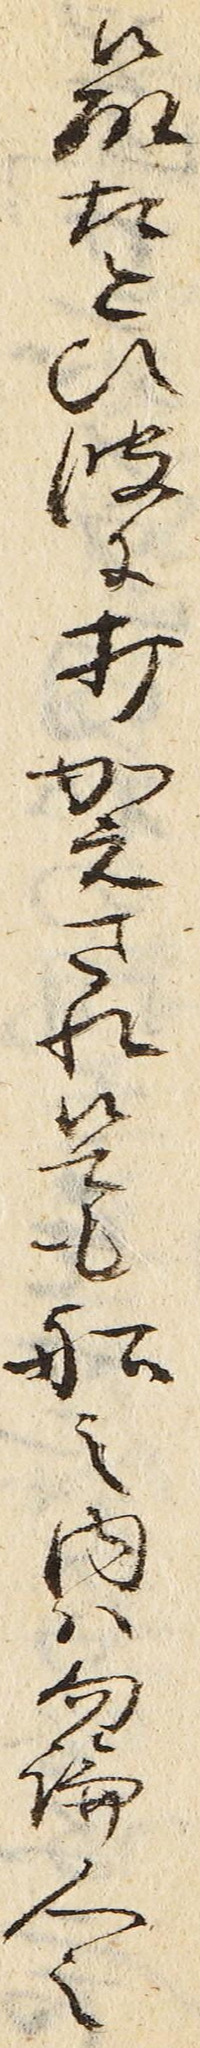候故たとひ波に打かえされ候ても船之内は勿論人之
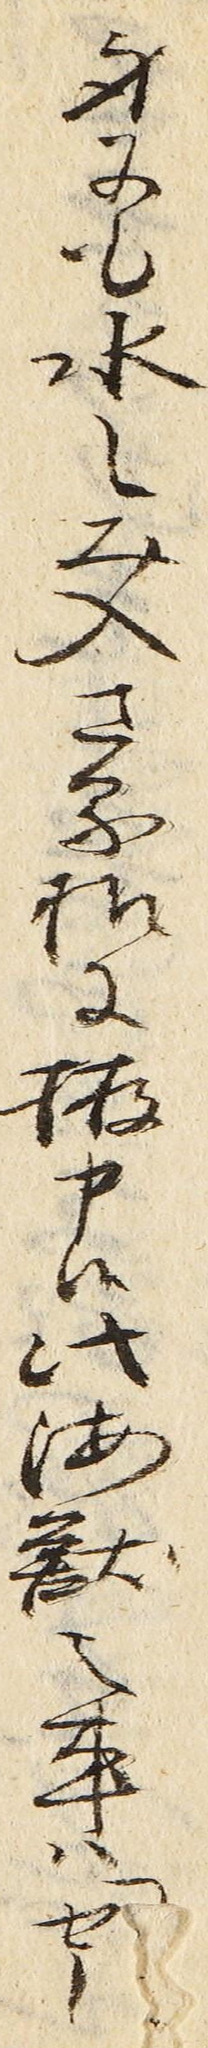身にも水しみ入さる様に拵申候此海獣之事は「セー
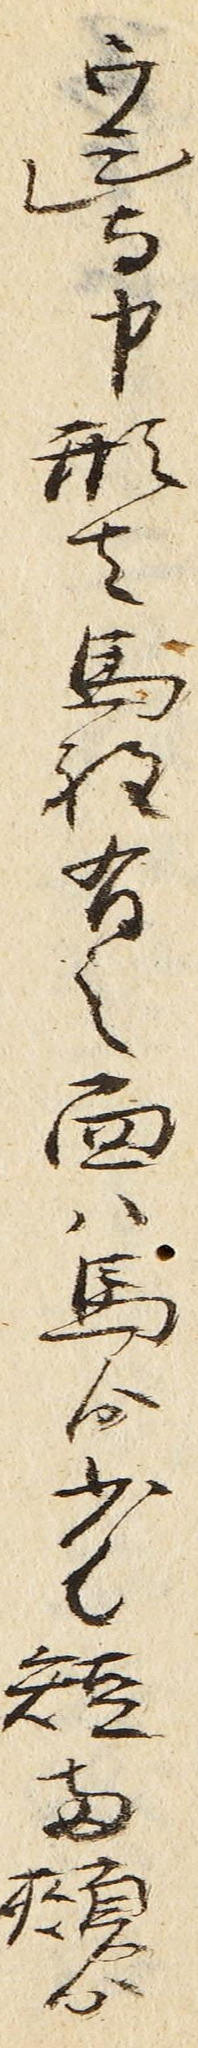ウシ」と申形は馬程有之面は馬ゟ少し短両頬ゟ
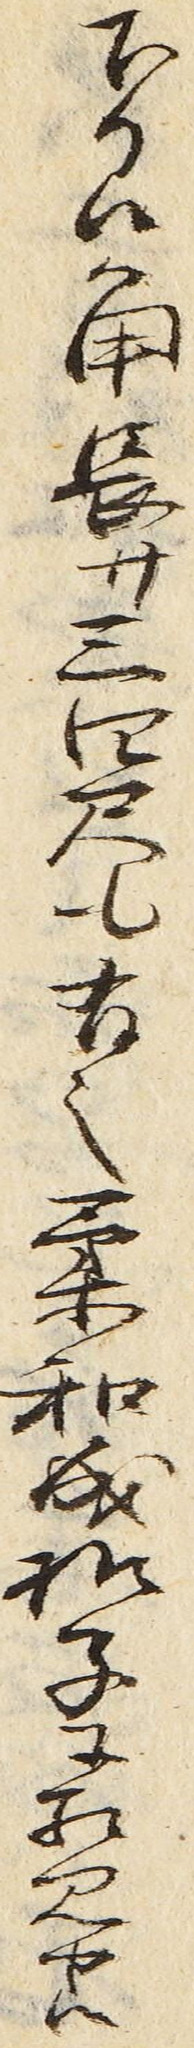下り候角長サ三四尺も有之柔和成様子に相見申候
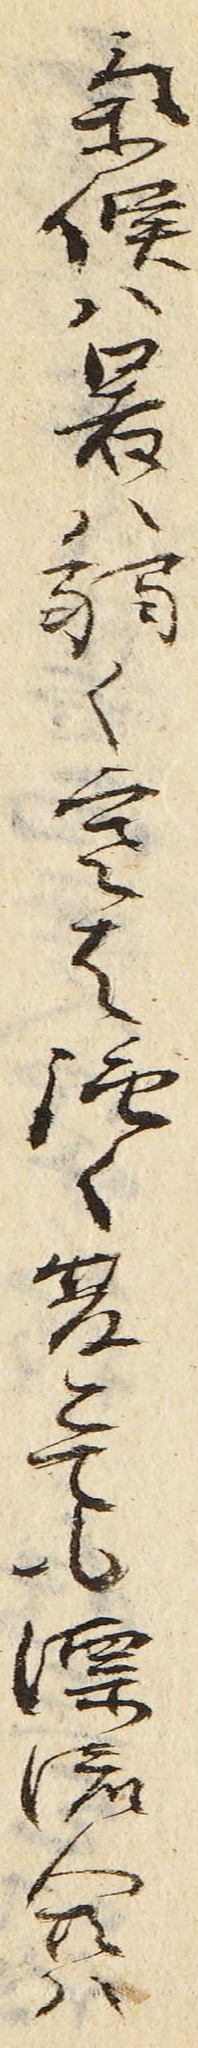気候は暑は弱く寒は強く夏とても漂流人共は
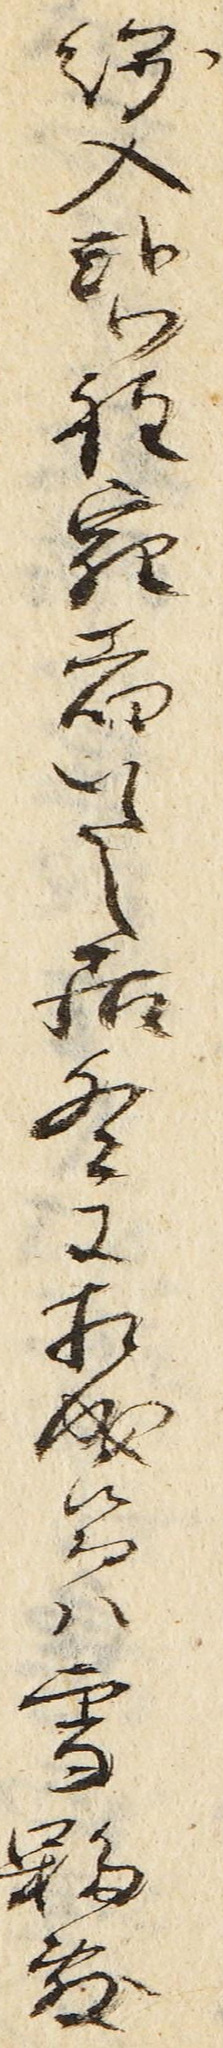綿入弐ッ程宛着いたし居冬に相成候ては雪夥敷
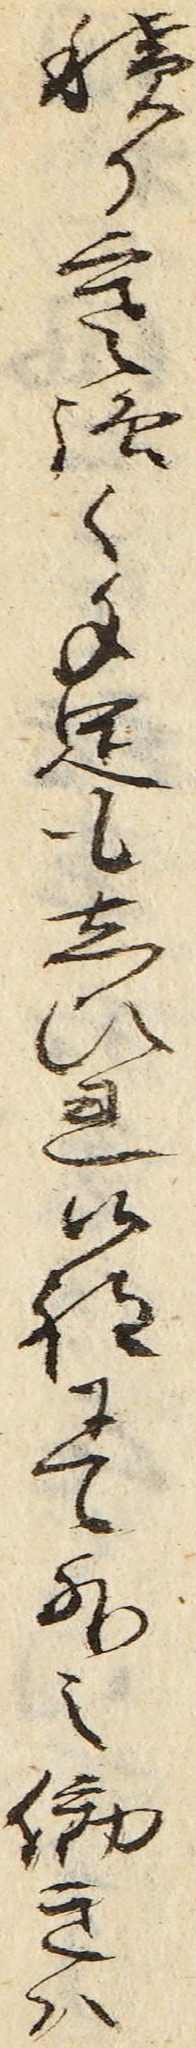積り寒強く手足もしひれ候程にて外之働きは
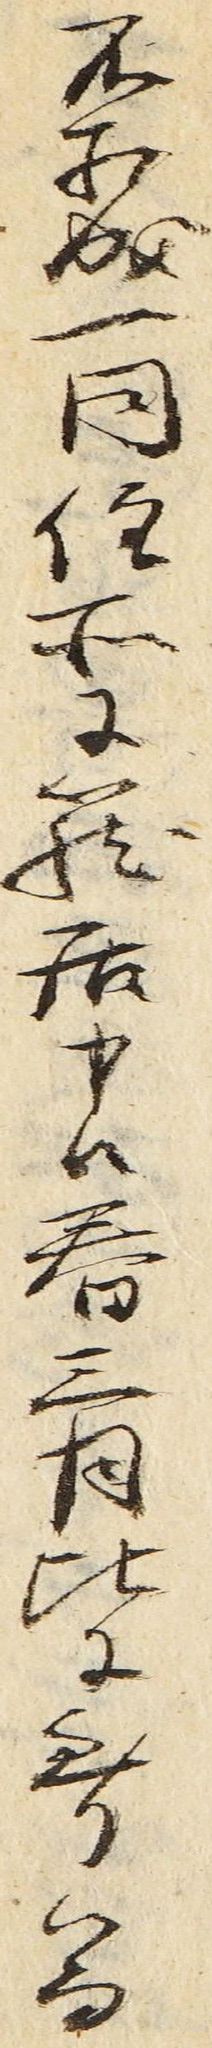不相成一同住所に篭居申候春三月比に至り候て
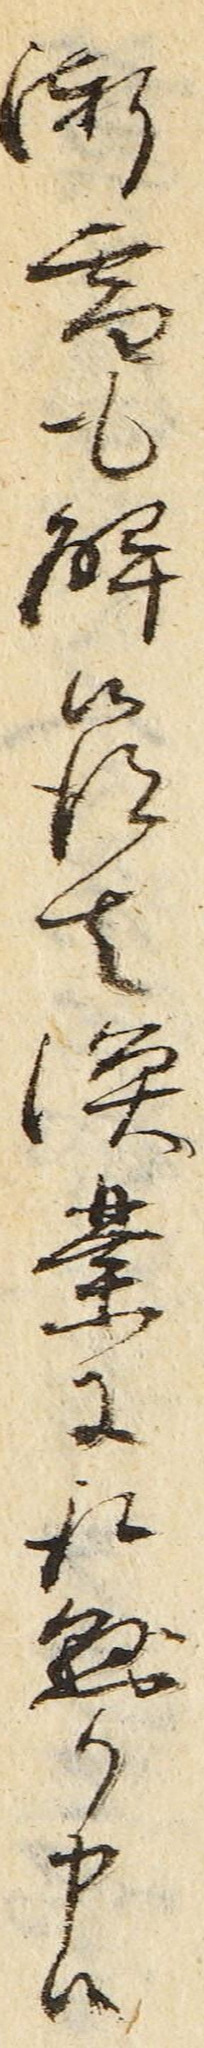漸雪も解候得は漁業に取懸り申候

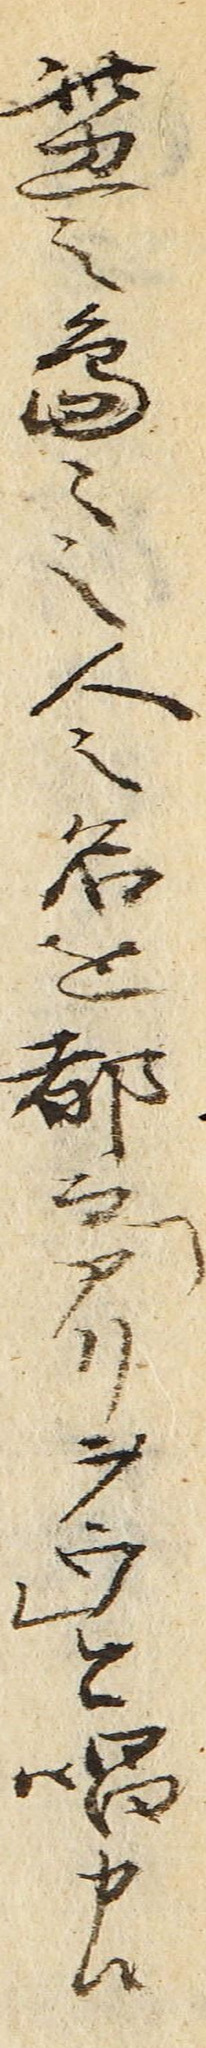此辺之島々之人之名を都て「アリヲウ」と唱申候
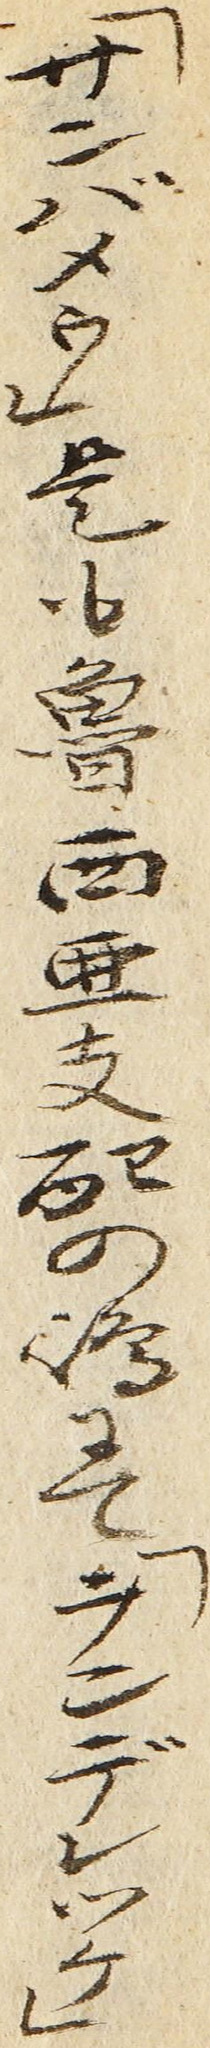「サンバメウ」是も魯西亜支配の島にて「ランデレツケ」
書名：漂民後記
